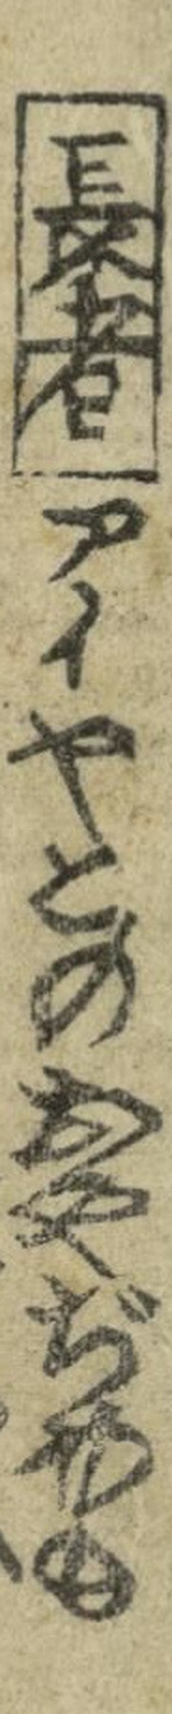長者アイヤこのおやぢめも
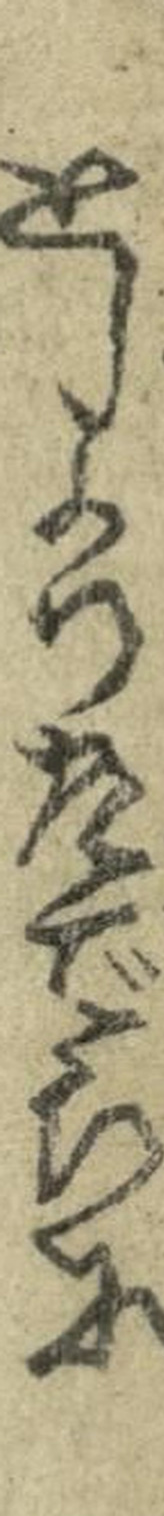としよりたでらに
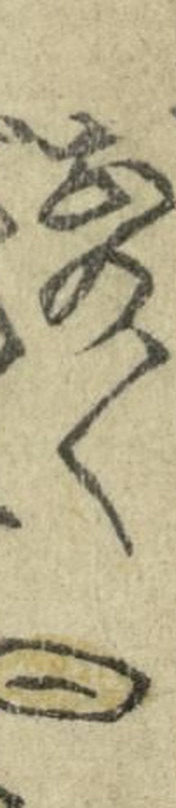おの〳〵
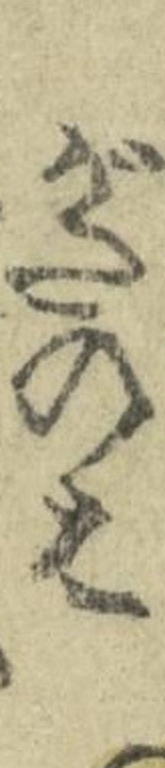がたのは
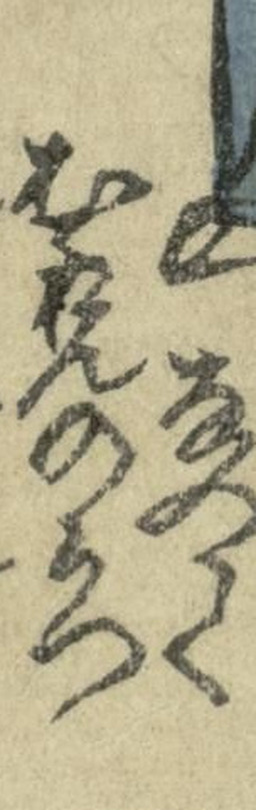むねんのうつ
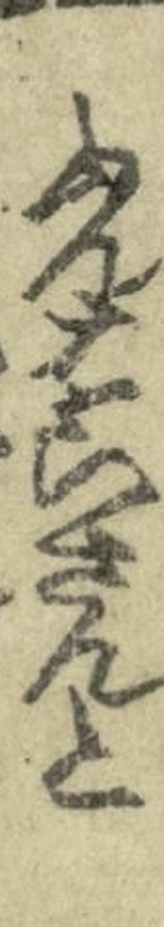ふんはらさんと
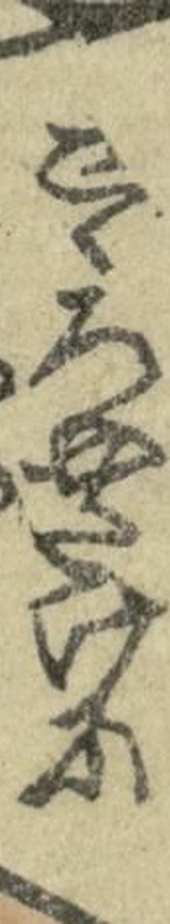こゝろやたけに
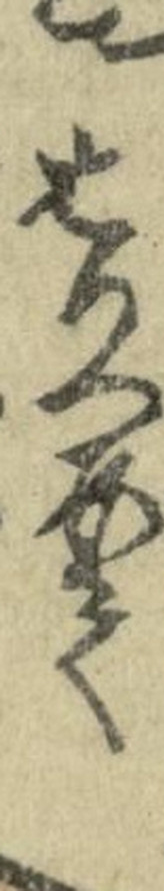はりつめて
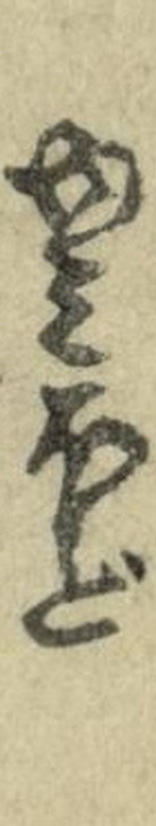ゆみほど
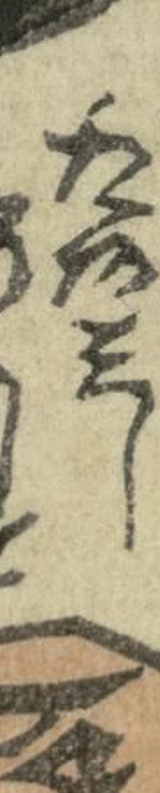たはみし
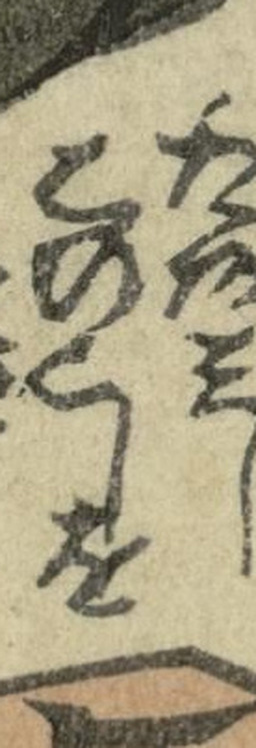このこしを
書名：[切腹鯰]
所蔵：東京大学地震研究所図書室 Earthquake Research Institute Library, The University of Tokyo, JAPAN
